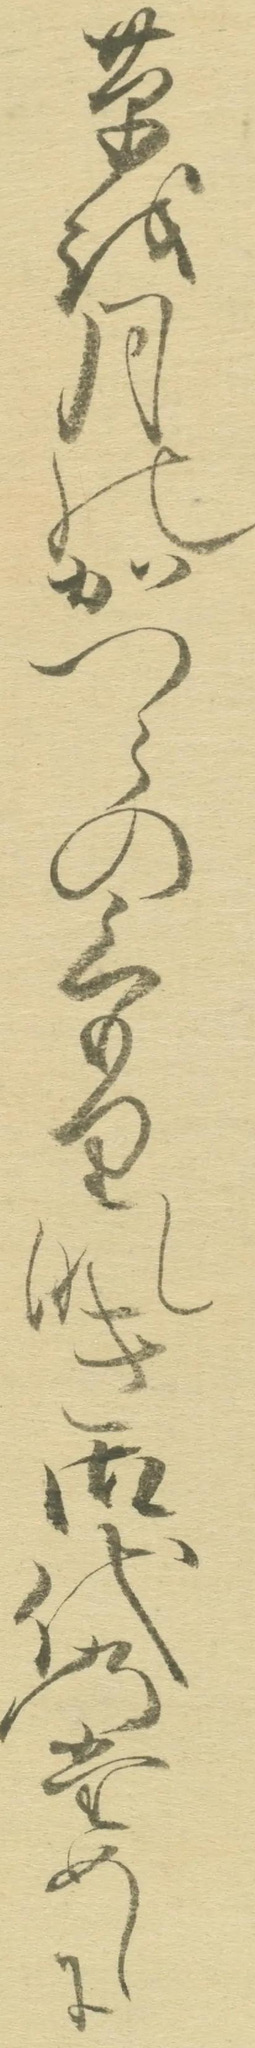草を月のかつらのくもりなき御代のためしに
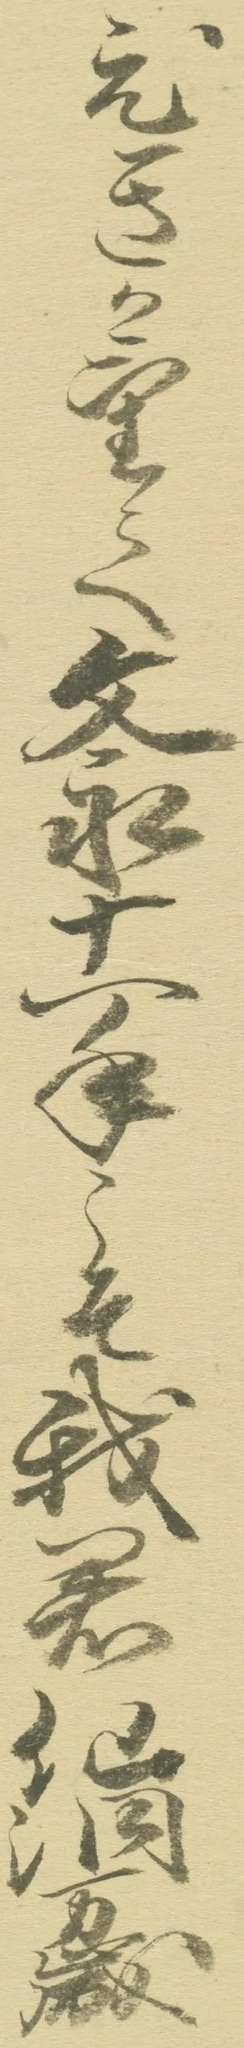ひきかけて文永十一年こそ我君仙洞万歳
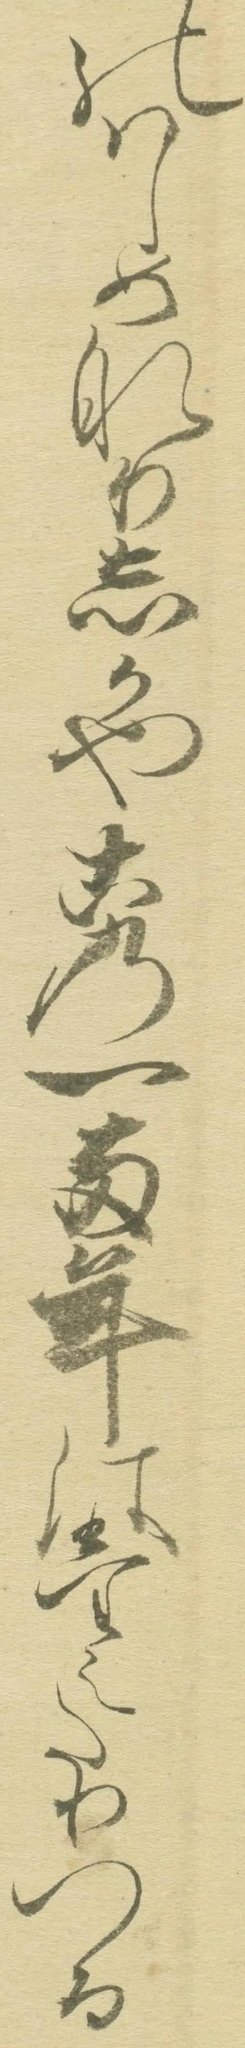のはしめなりしかやこの一両年はたえたりつる
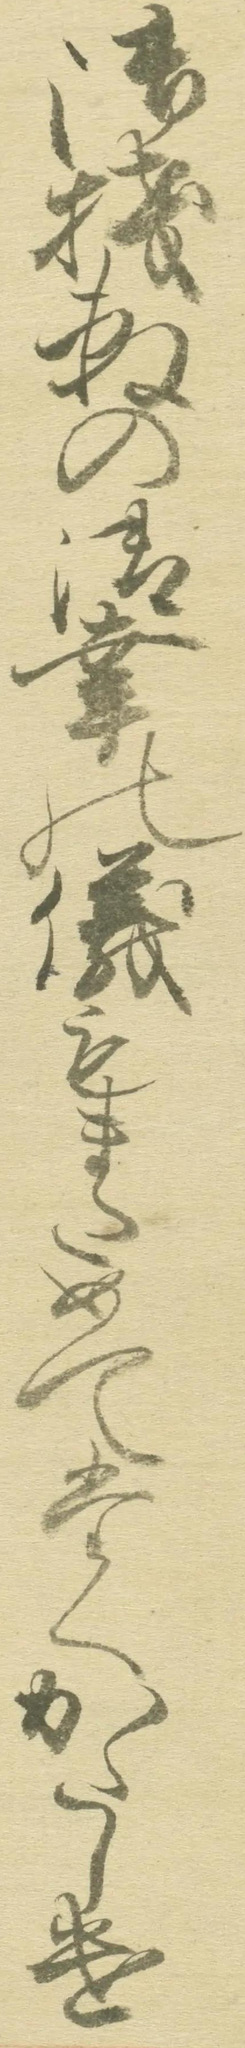御桟敷の御幸の儀もまためてたくかたしけ
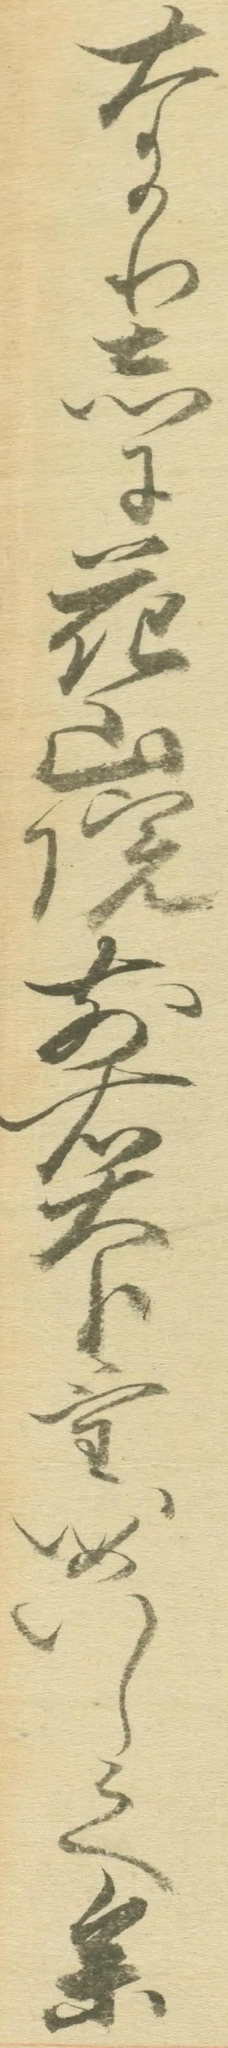なかりしに花山院前右大臣けいめいして参
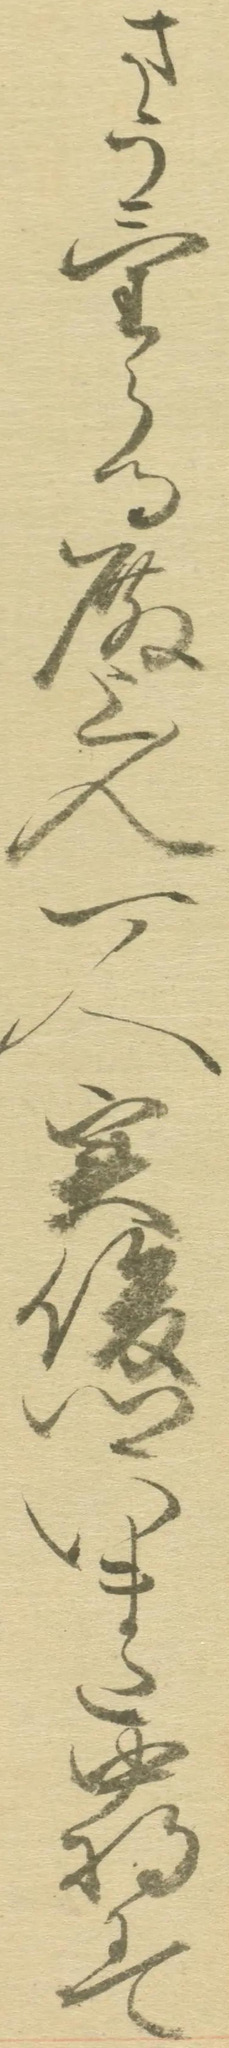まうけらる殿上人一人実俊卿いまた中将にて
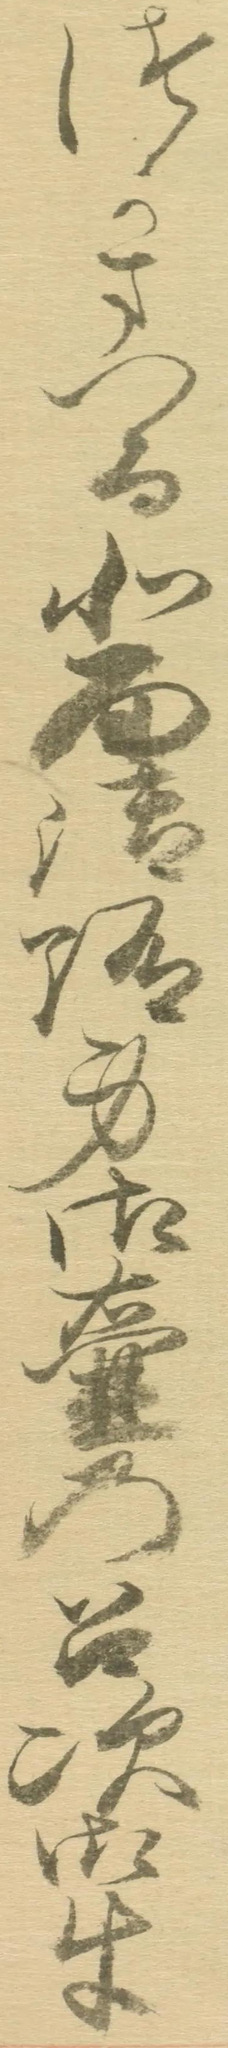つかまつる北面御随身御壷の召次御牛
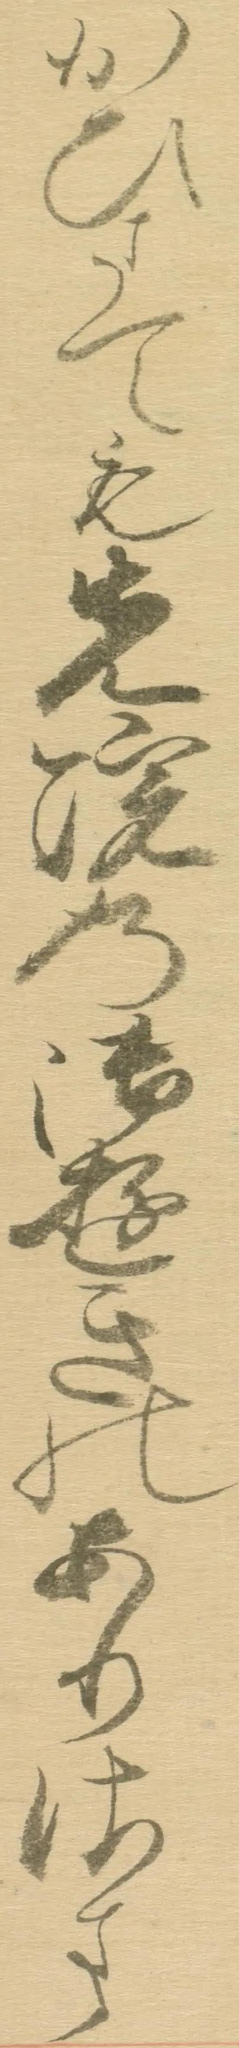かひまても先院の御ゆきのありさま
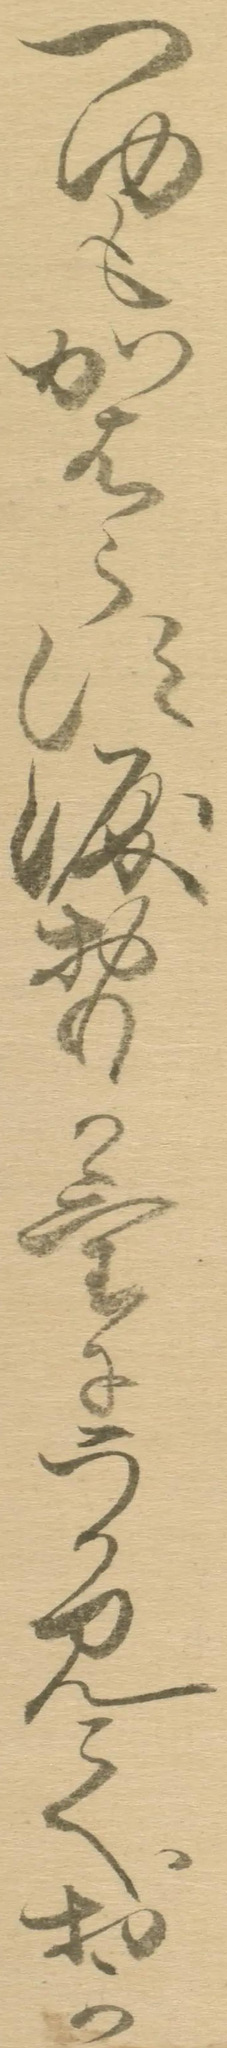つゆもかはらす涙おもかけにうかみておか

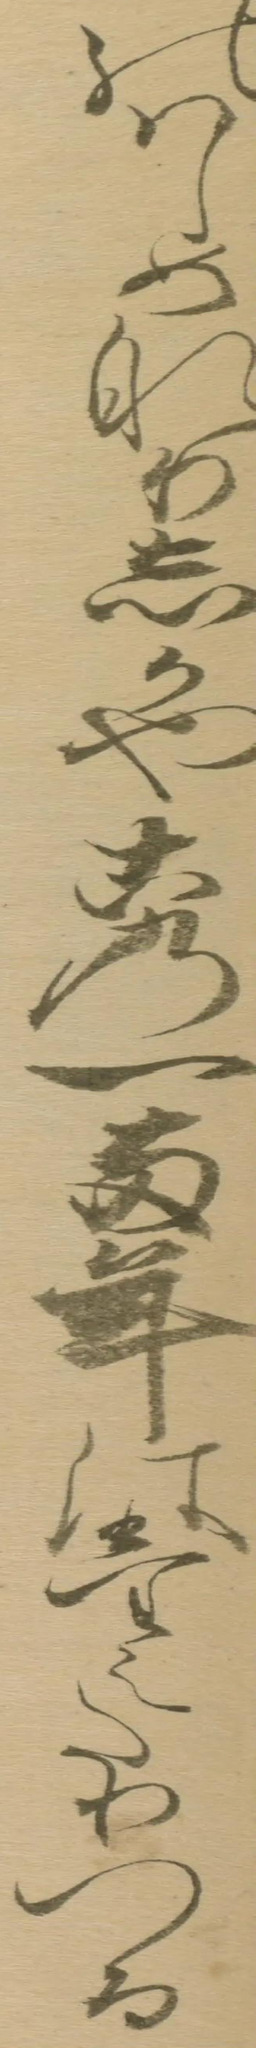のはしめなりしかやこの一両年はたえたりつる
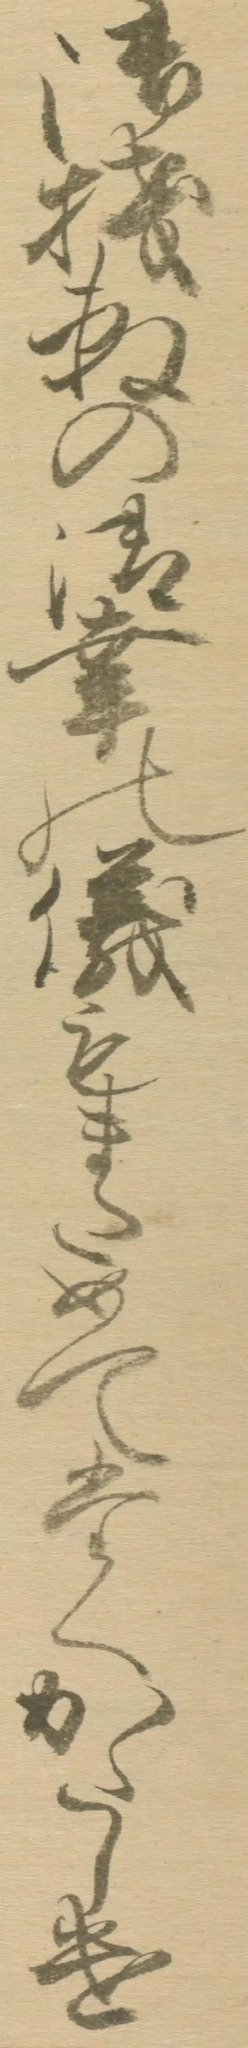御桟敷の御幸の儀もまためてたくかたしけ
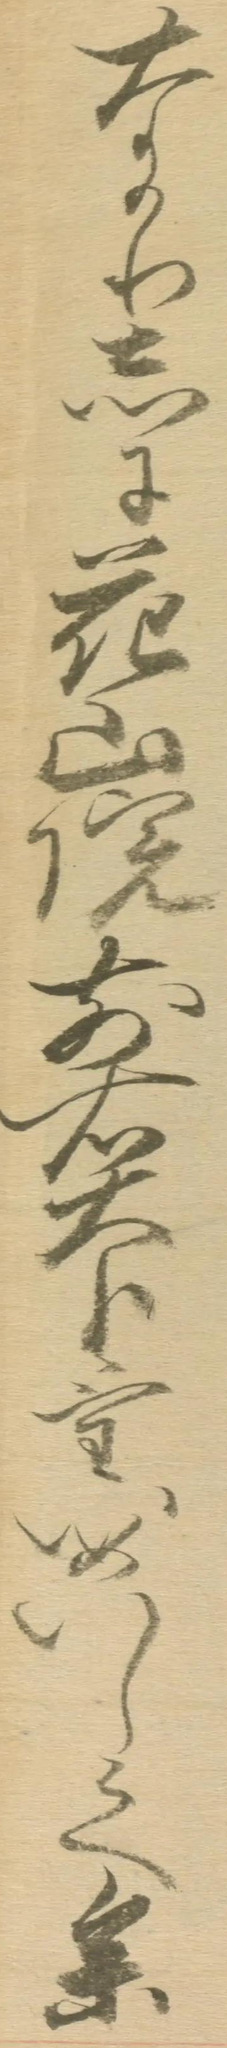なかりしに花山院前右大臣けいめいして参
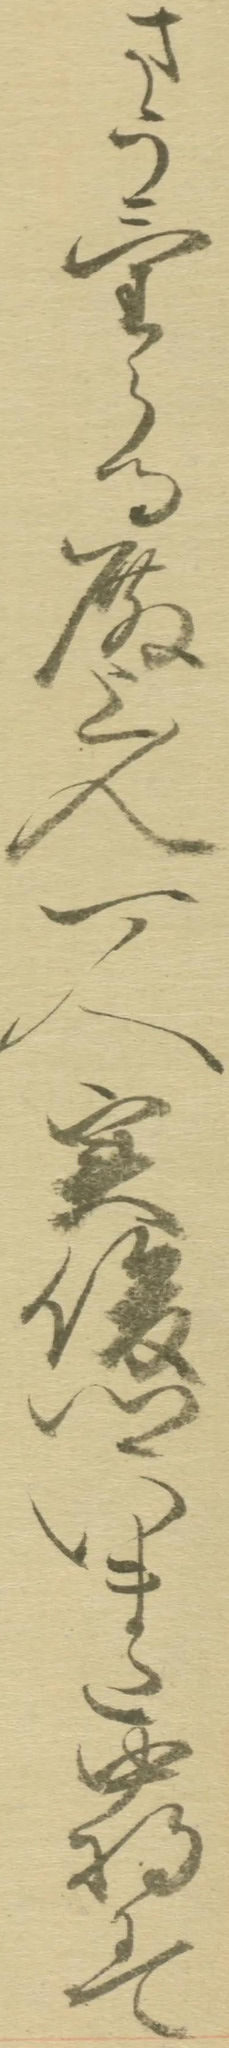まうけらる殿上人一人実俊卿いまた中将にて
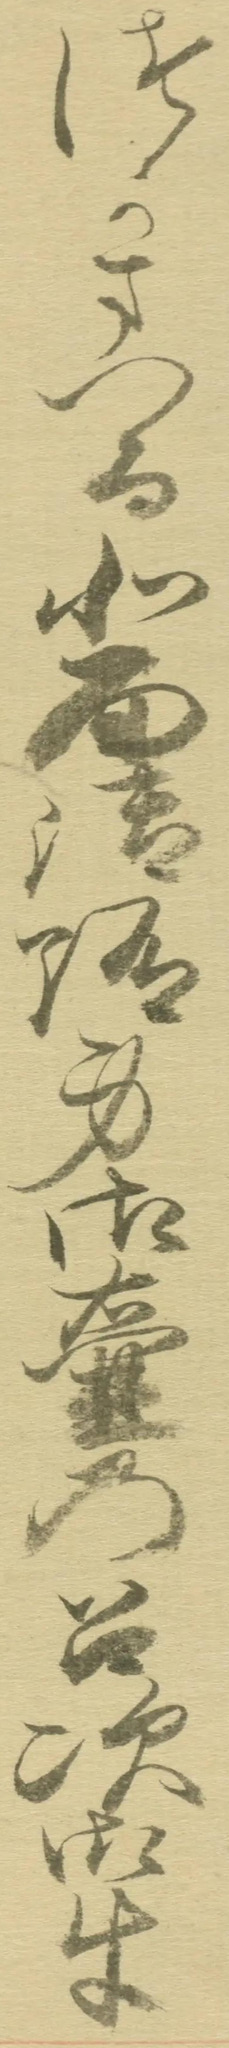つかまつる北面御随身御壷の召次御牛
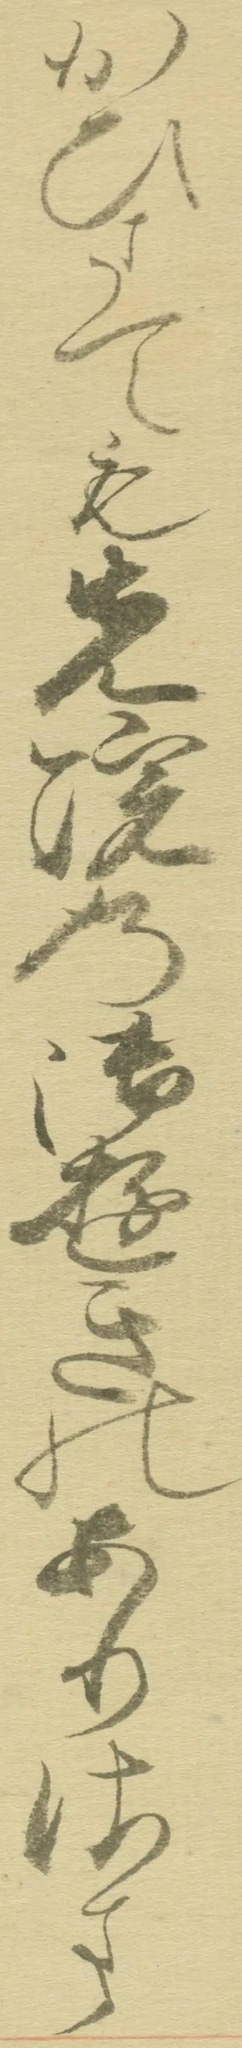かひまても先院の御ゆきのありさま
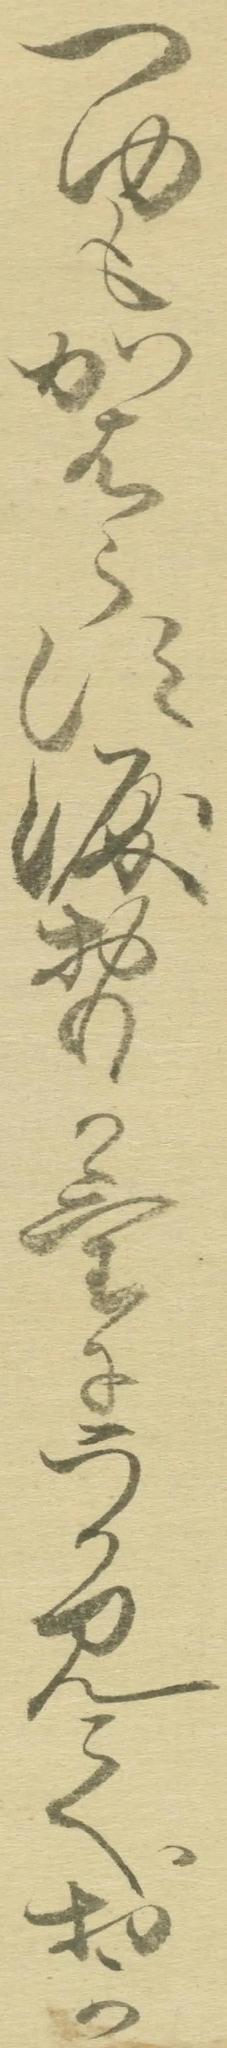つゆもかはらす涙おもかけにうかみておか
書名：賀茂祭縁起
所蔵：国立国会図書館 National Diet Library, JAPAN
